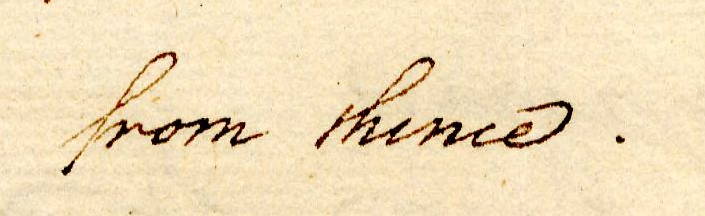from thence.
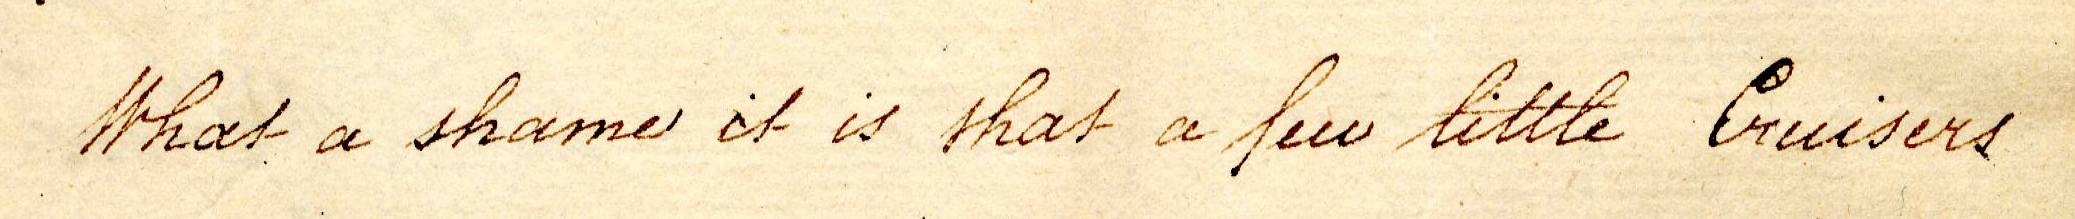What a shame it is that a few little Cruisers
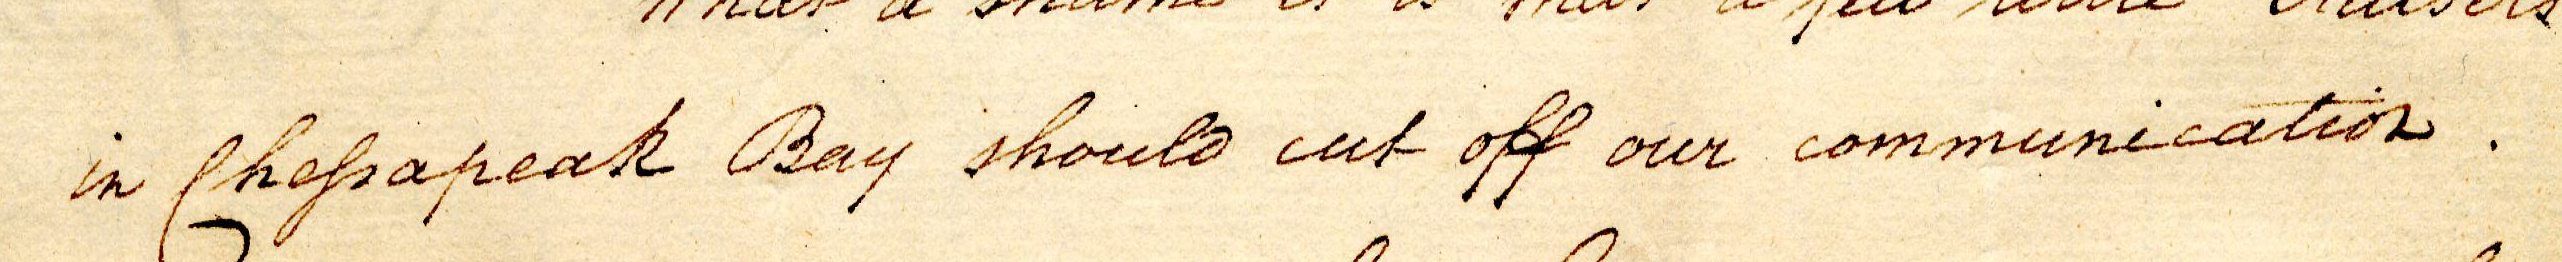in Chessapeak Bay should cut off our communication.
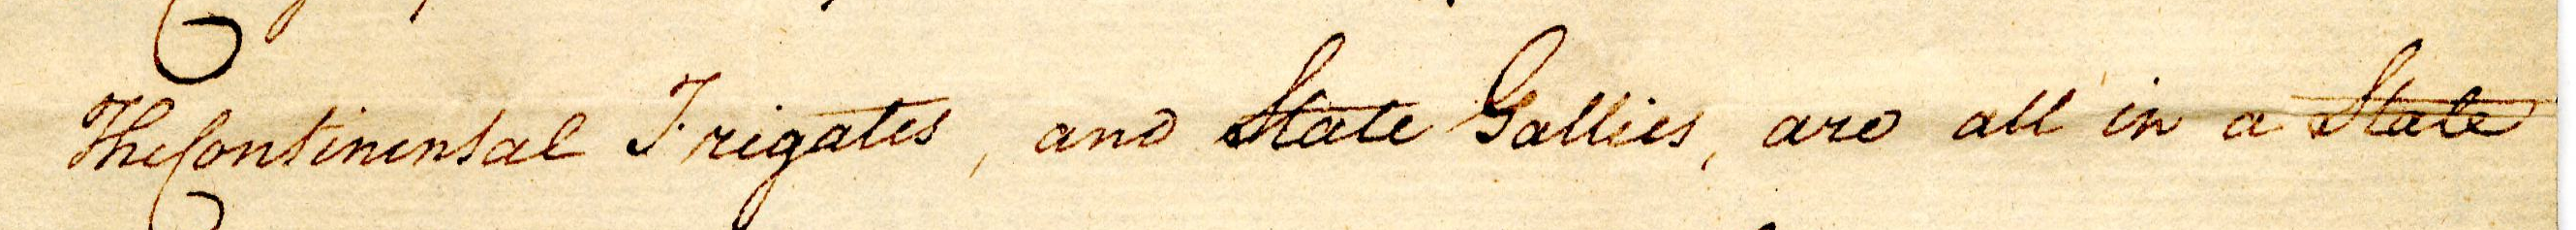Transcontinental Frigates, and State Gallies, are all in a State
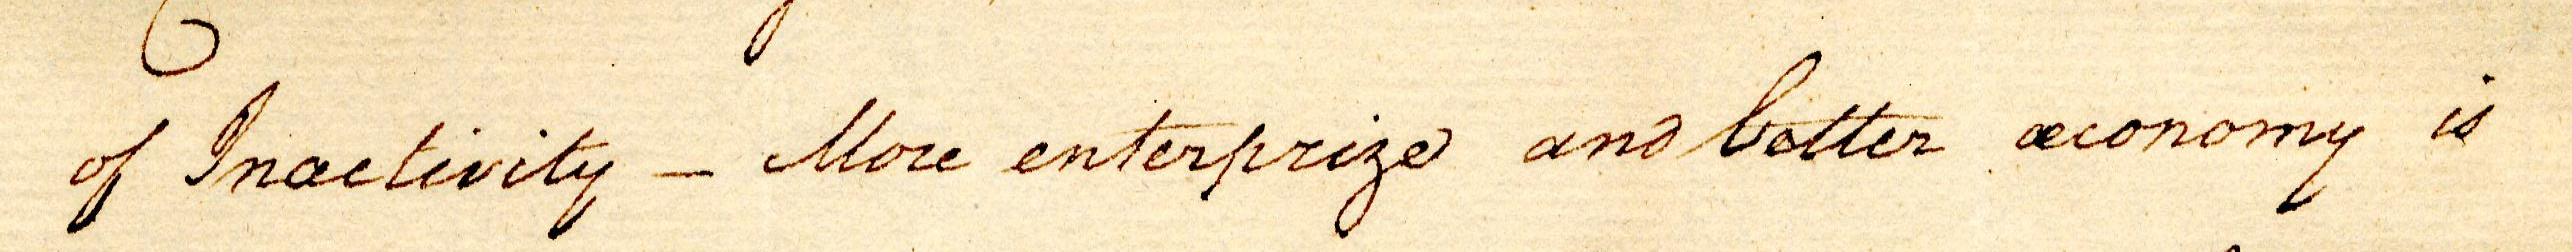of Inactivity- More enterprize and better oeconomy is
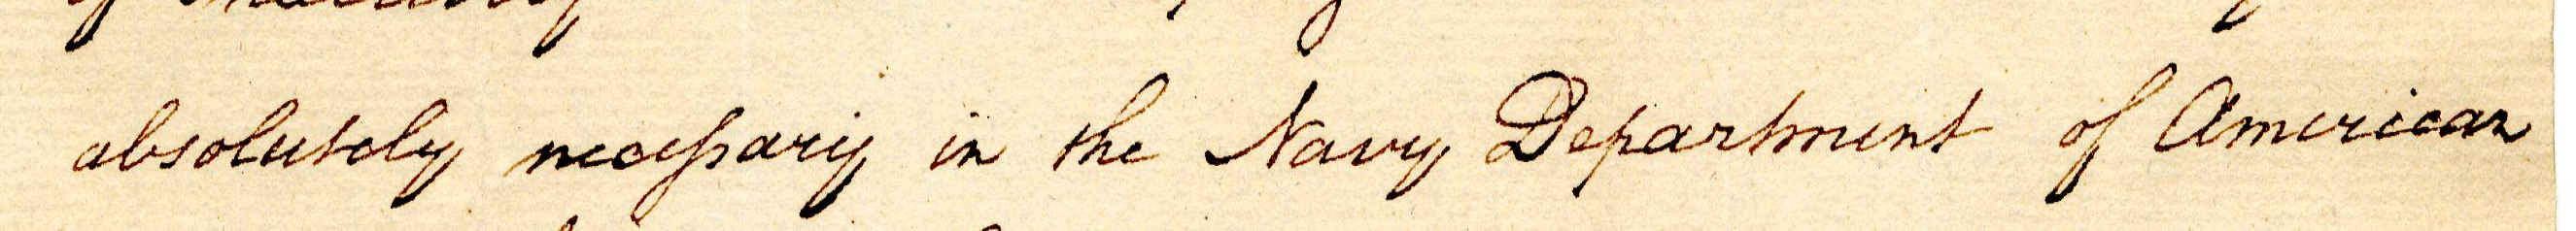absolutely necessary in the Navy Department of American
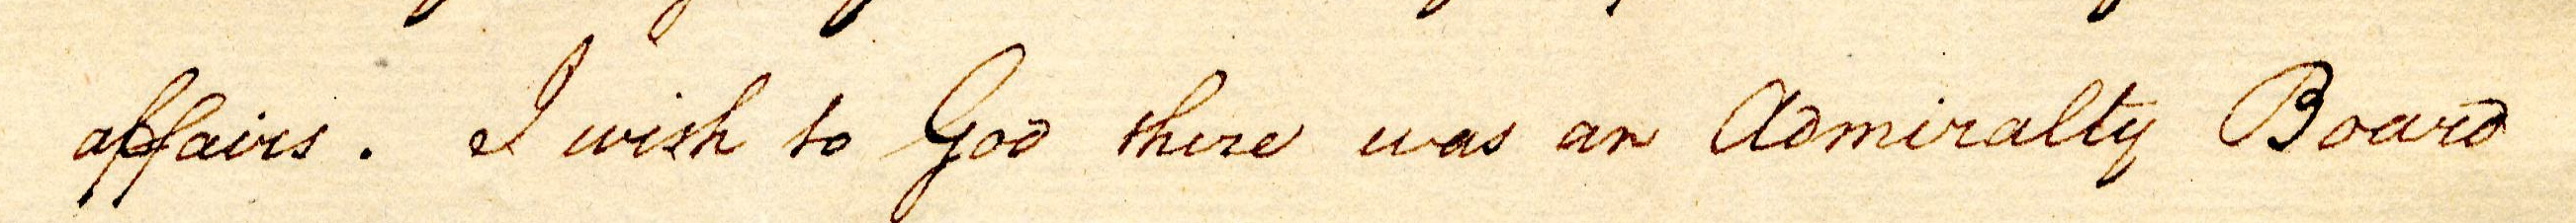affairs. I wish to God there was an Admiralty Board
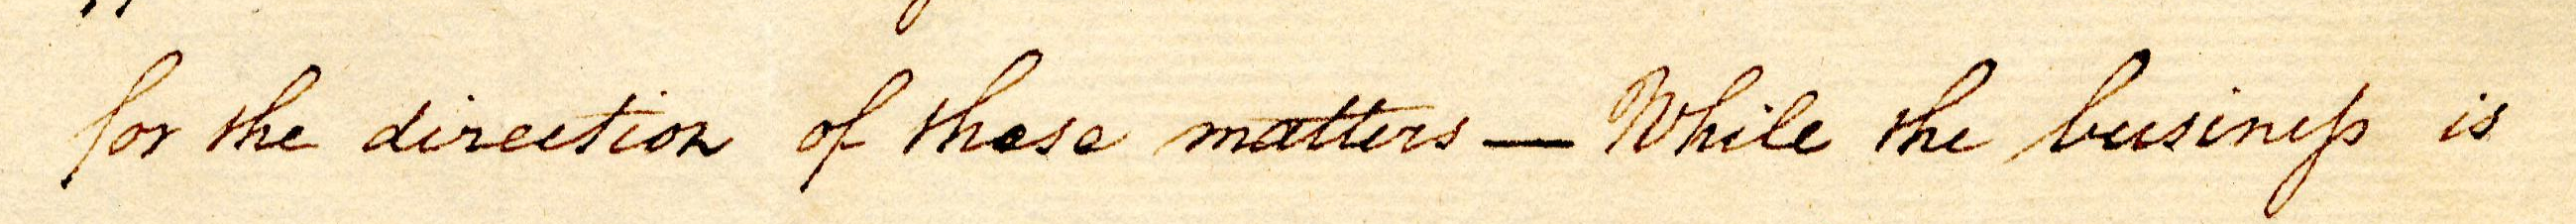for the direction of those matters- While the business is
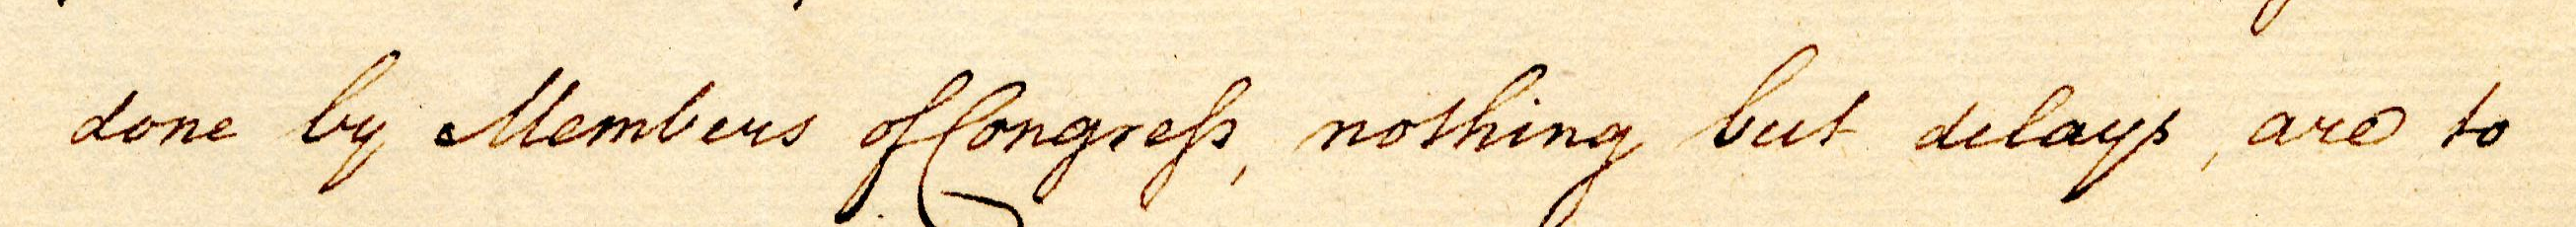done by Members of Congress, nothing but delays are to
